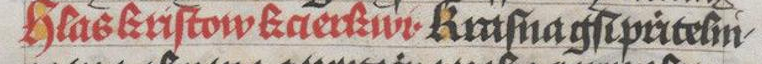Hlas kriſtow k cierkwi. Kraſna gſi pṙitelni¬
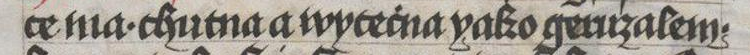ce mal. chutna a wyteċna yako geruzalem.
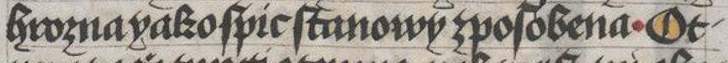hrozna yako ſpic ſtanowy zpoſobena.Ot¬
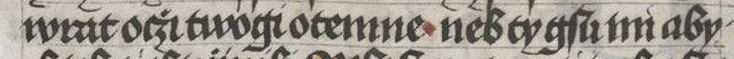wrat ocżi twogi otemne.neb ty gſu mi aby¬
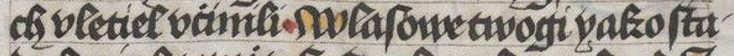ch vletiel vċínilí. Wlaſowe twogi yako ſta¬
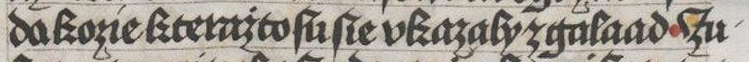dakozíe kterażto ſu ſíe vkazaly zgalaad. Zu¬
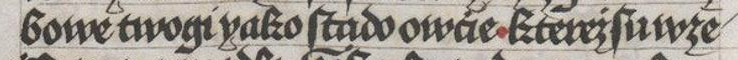bowe twogí yako ſtado owċíe.ktereżſu wze¬
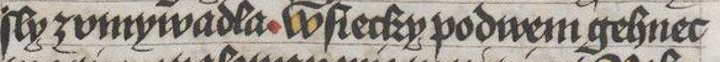ẛly z vmywadla.Wẛiecky podwem gehnec
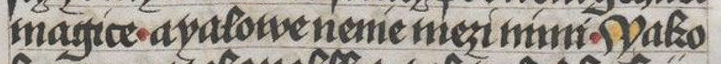magíce.a yalowe neníe mezi ními.Yako
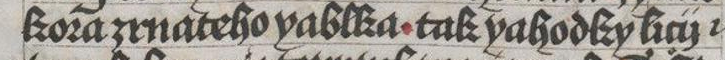koza zrnateho yablka.tak yahodky licij
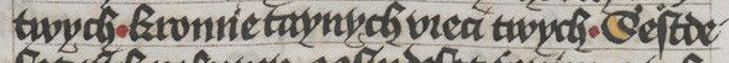twych.kromie taynych viecí twych.Ṡeſtde¬
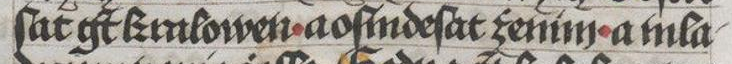ſat ḡt kralowen.a oſmdeſat żenim.a mla¬
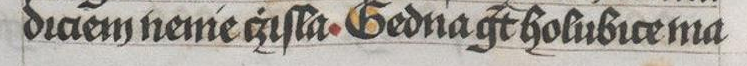diciem nenie cżiſla.Gedna ḡt holubice ma
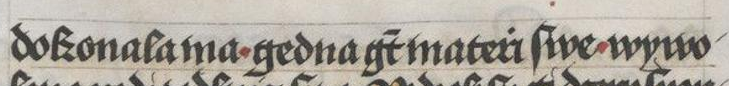dokonala ma.gedna ḡt mateṙi ſwe.wywo¬
